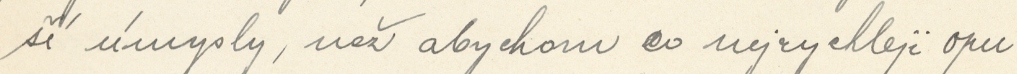ší úmysly, než abychom co nejrychleji opu-
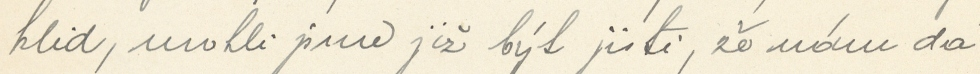klid, mohli jsme již být jisti, že nám dá
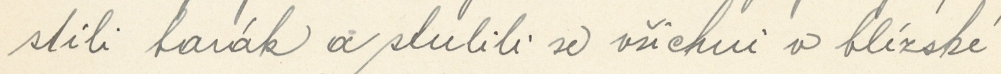stili barák a stulili se všichni v blízké
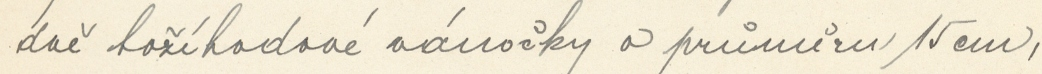dvě božíhodové vánočky o průměru 15 cm,
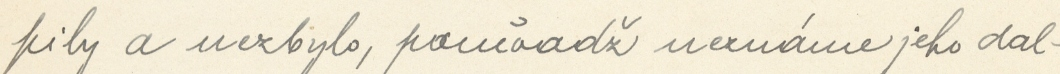pily a nezbylo, poněvadž neznáme jeho dal-
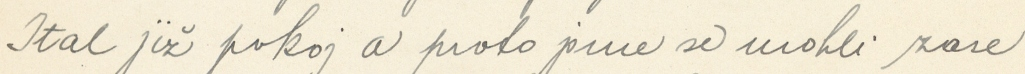Ital již pokoj a proto jsme se mohli zase
